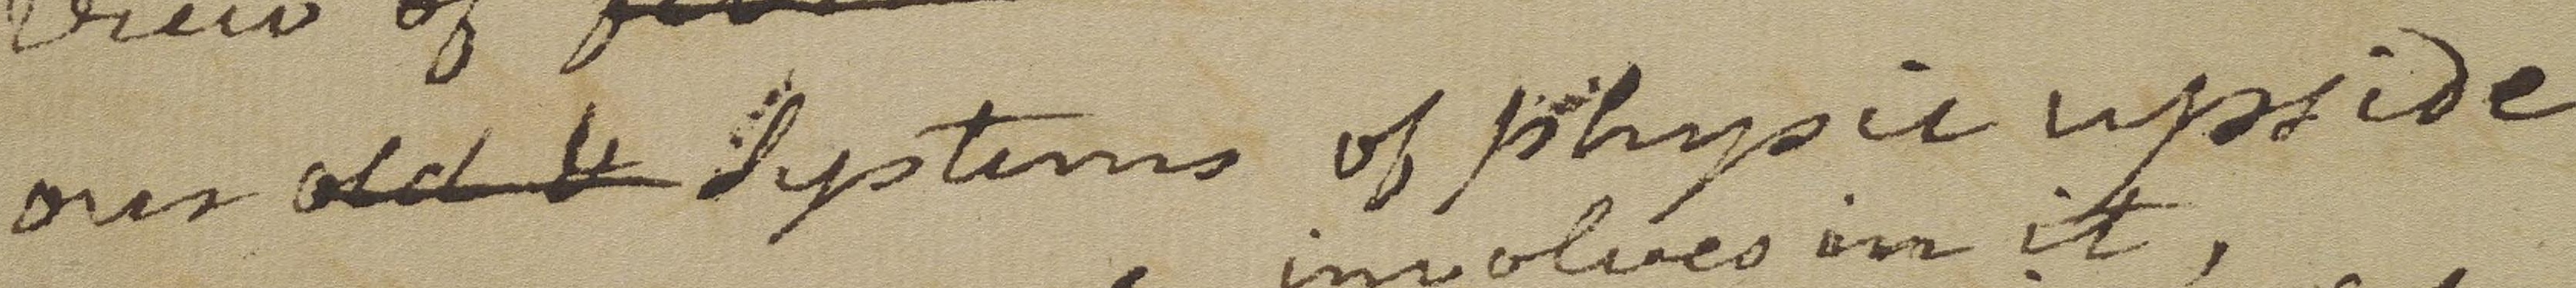our [old &] symptoms of physic upside
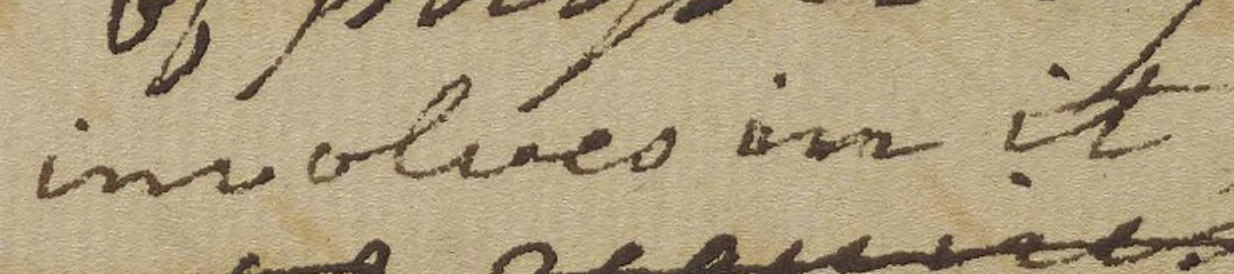involves in it
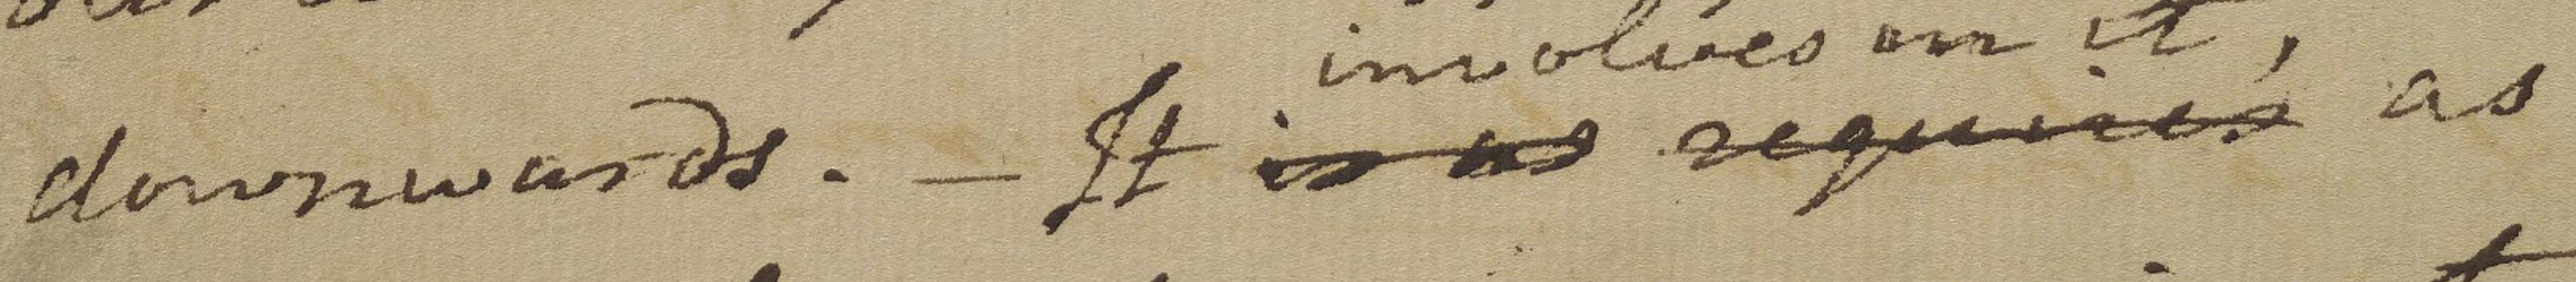downwards. It [is no] [requires] as
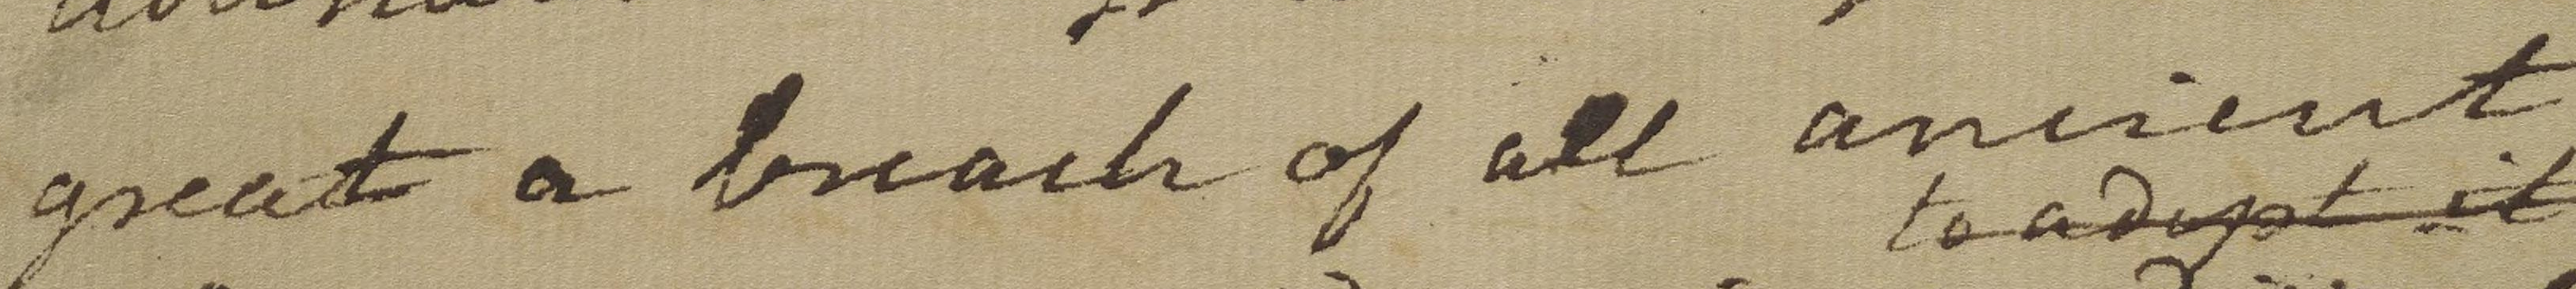great a breach of all ancient
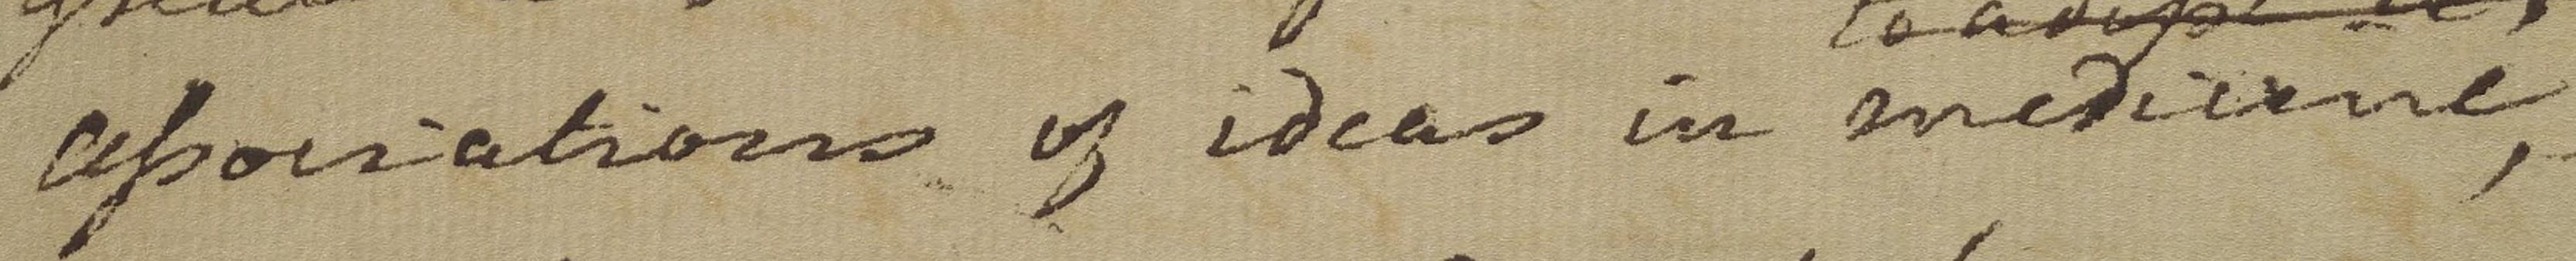associations of ideas in medicine,
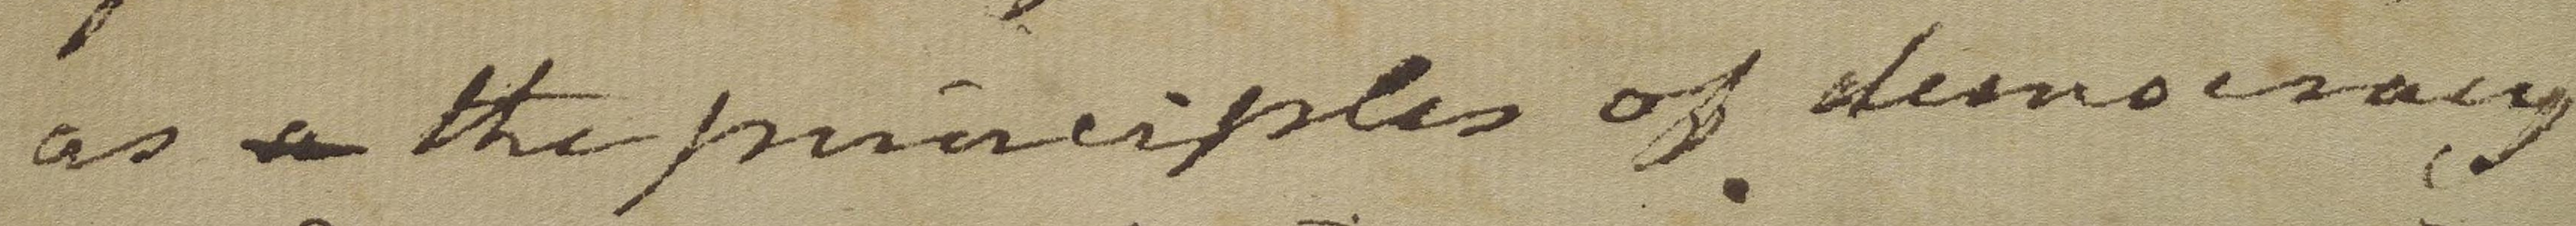as the principle of democracy
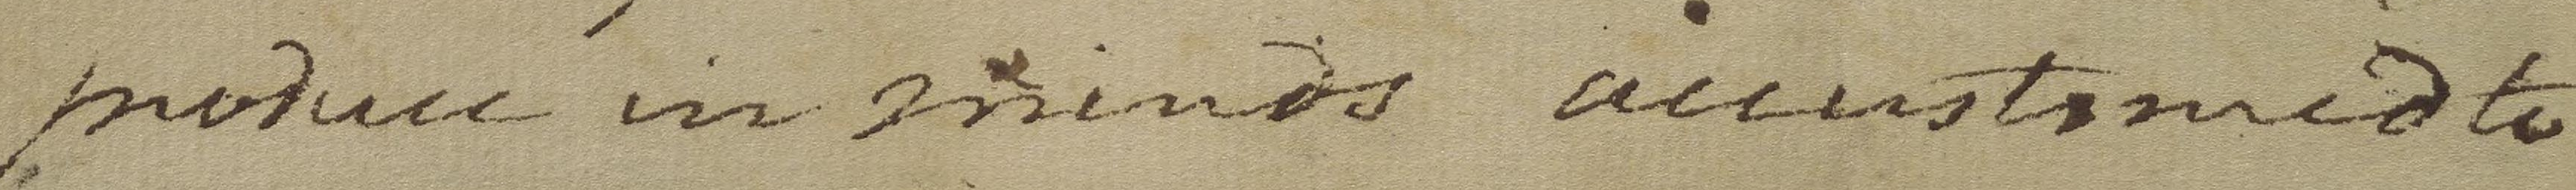produce in minds accustomed to
